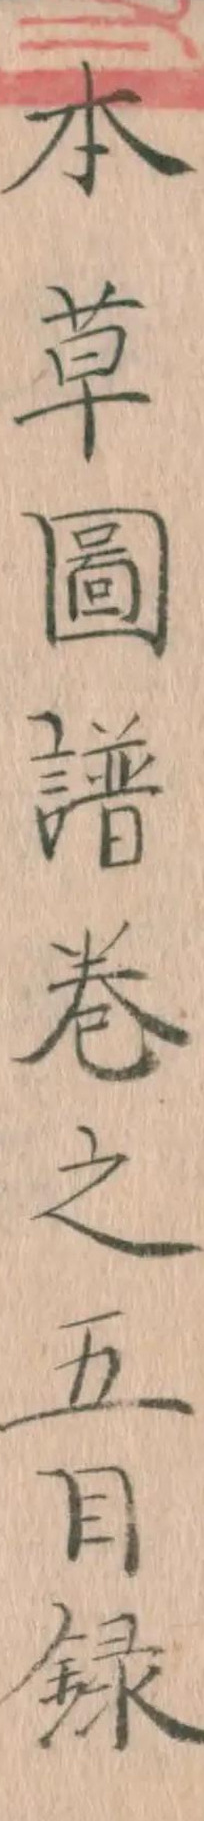本草図譜巻之五目録

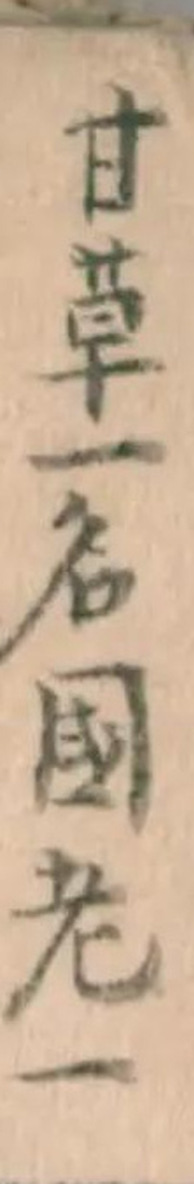甘草一名国老一
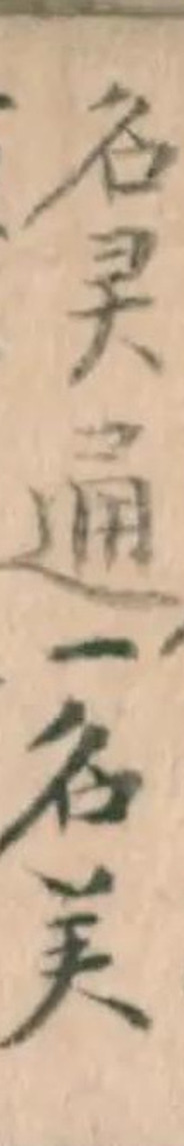名霊通一名美
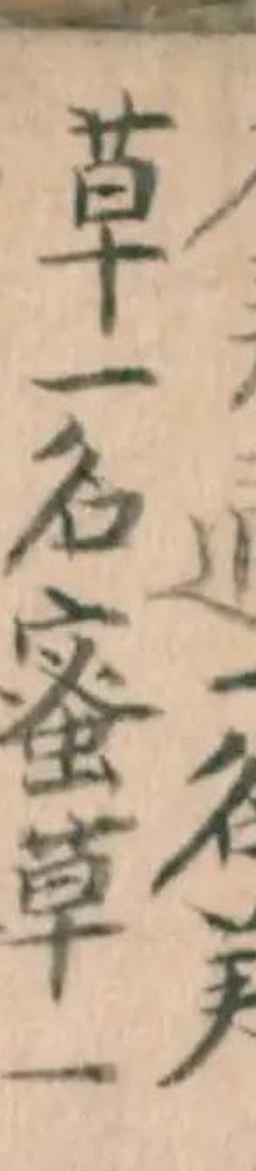草一名蜜草一
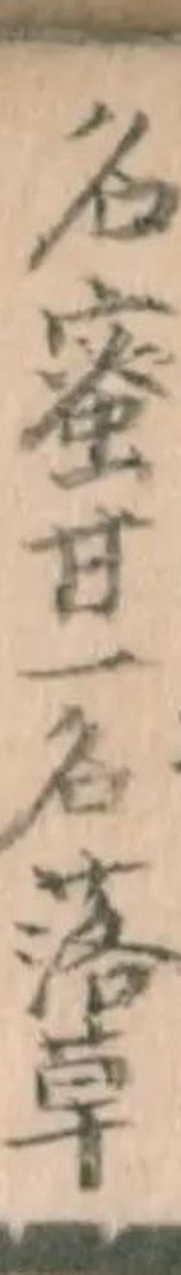名蜜甘一名落草
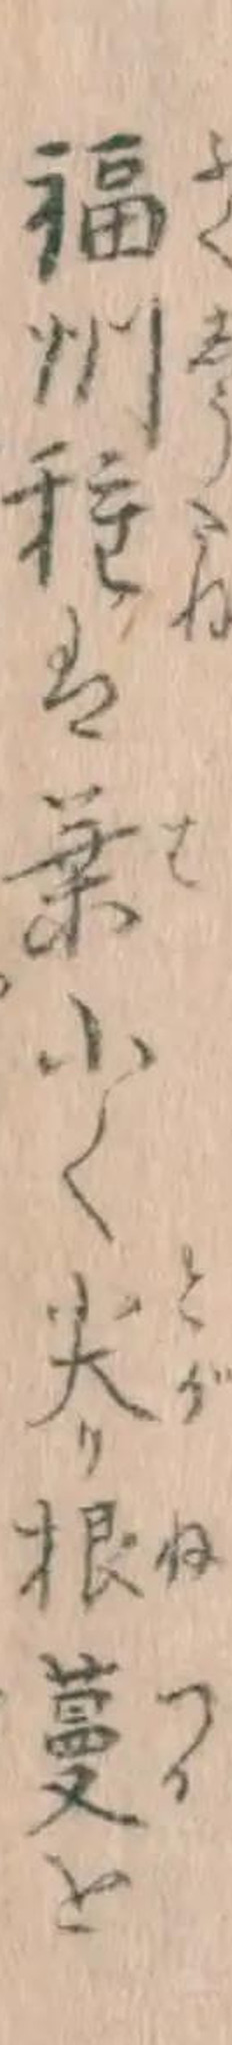福州種は葉小く尖り根蔓を
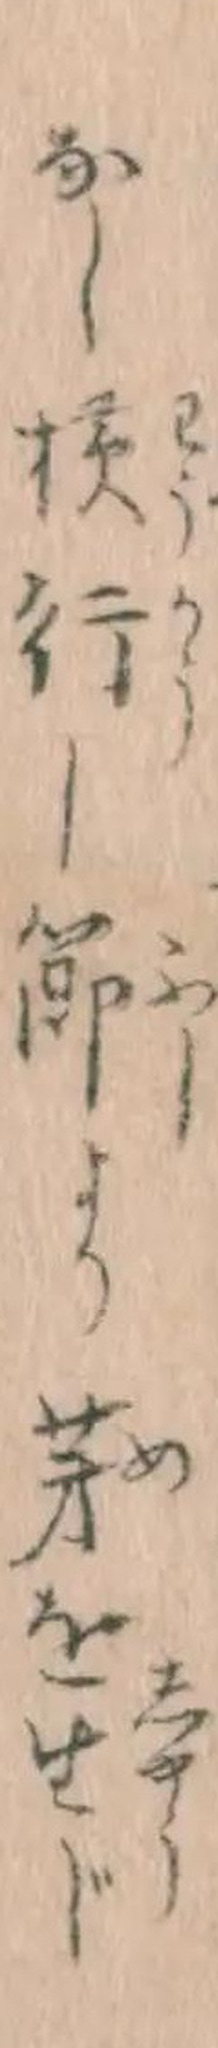なし横行し節より芽を生じ
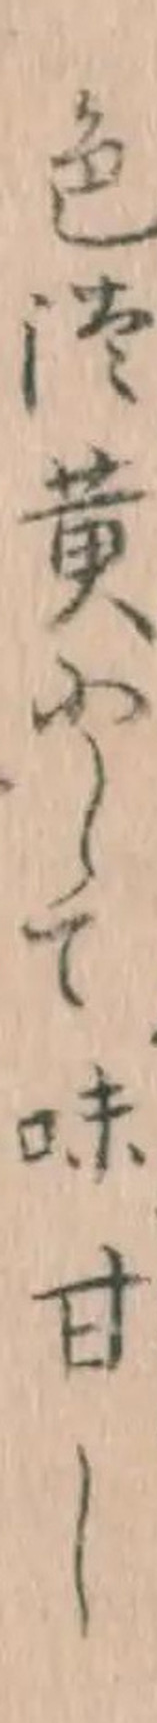色薄黄にして味甘し
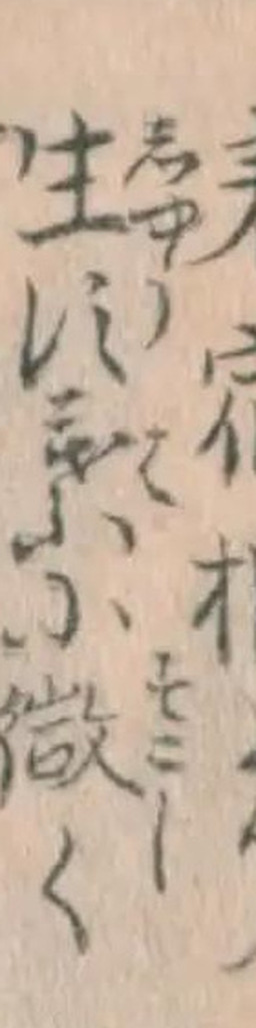生す葉に微く
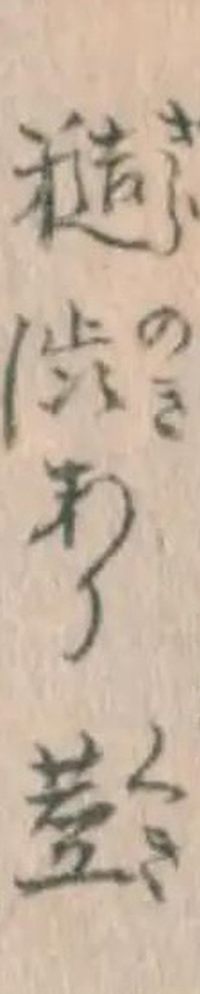糙渋あり茎
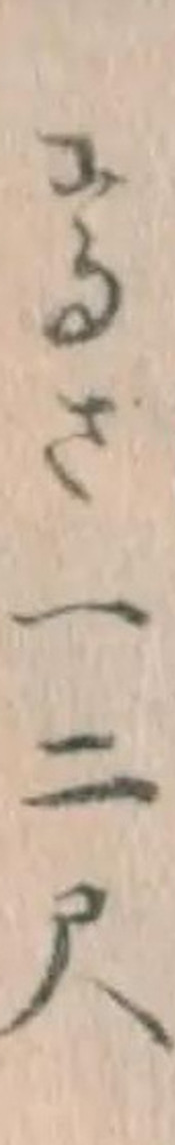高さ一二尺
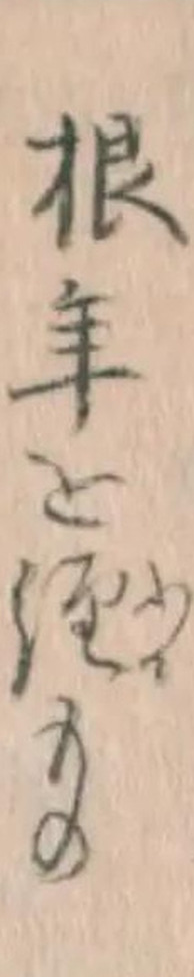根年を経もの
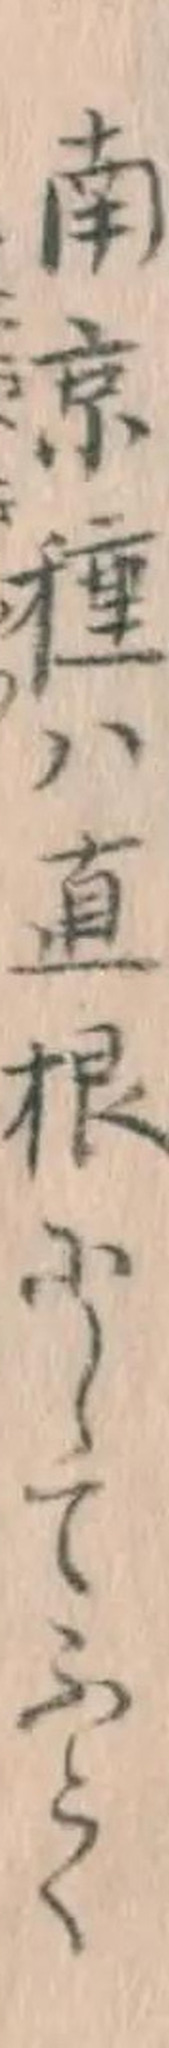南京種は直根にしてふとく
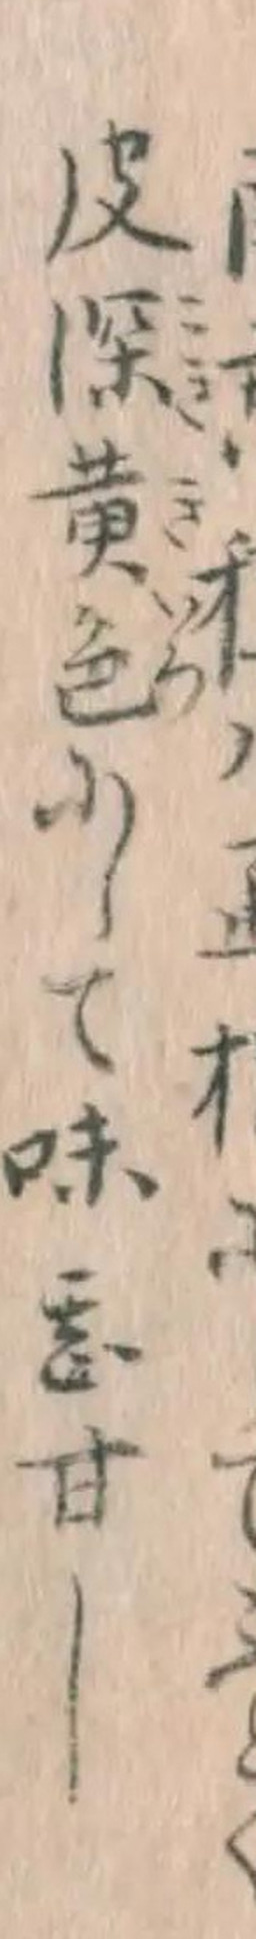皮濃黄色にして味甚甘し

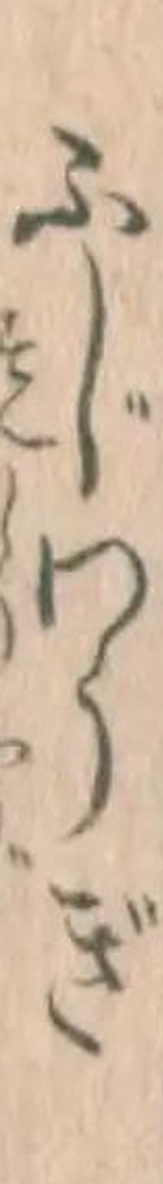ふじわうぎ
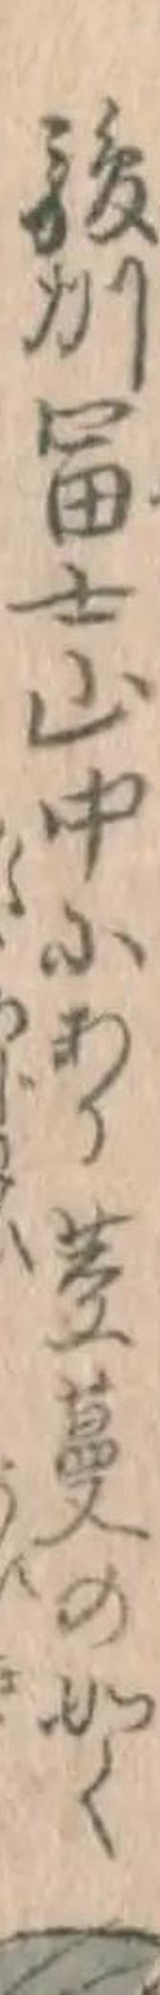駿州富士山中にあり茎蔓の如く
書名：本草図譜. 巻5-6
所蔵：国立国会図書館 National Diet Library, JAPAN
